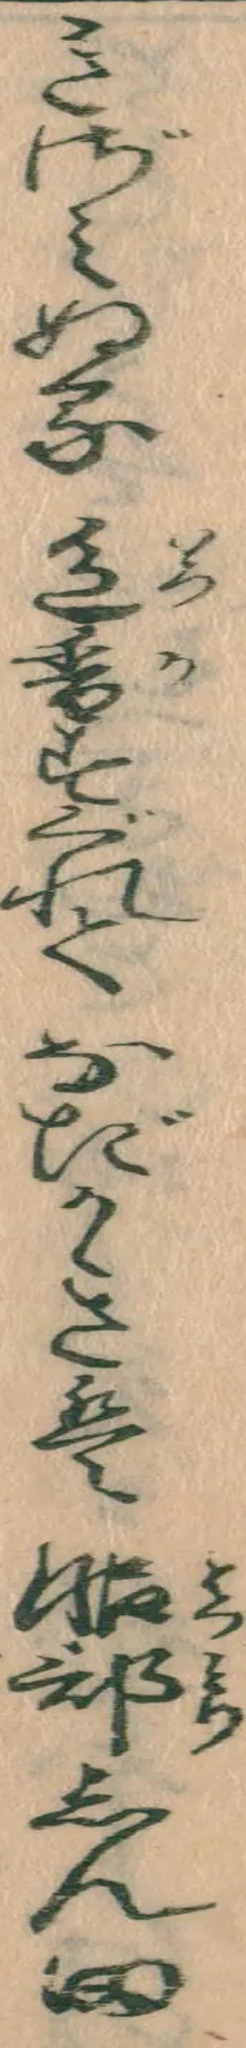きざみぬる色香すぐれてなだかきは服部しん田
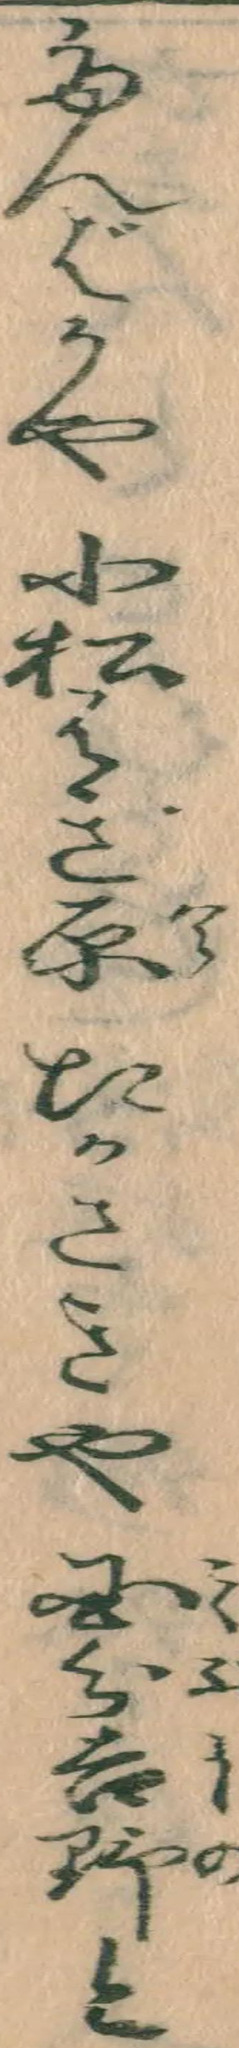たんばかや小松はき原たかさきや国分吉野と
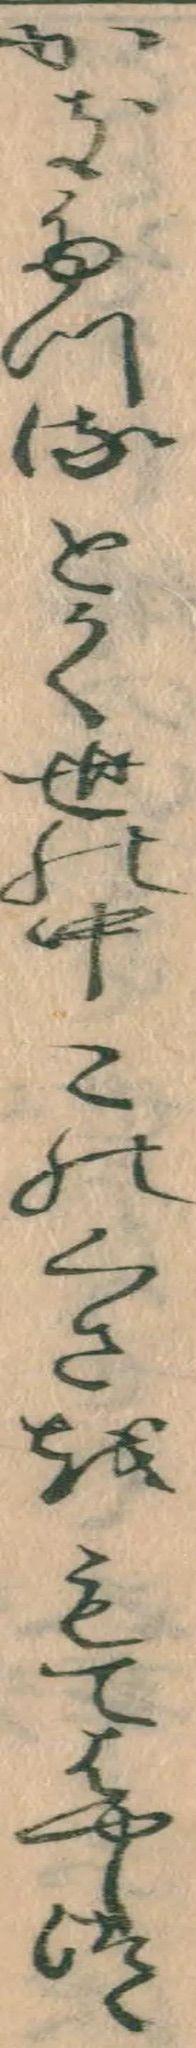かきたつるとかく世の中このくさをもてはやしつゝ
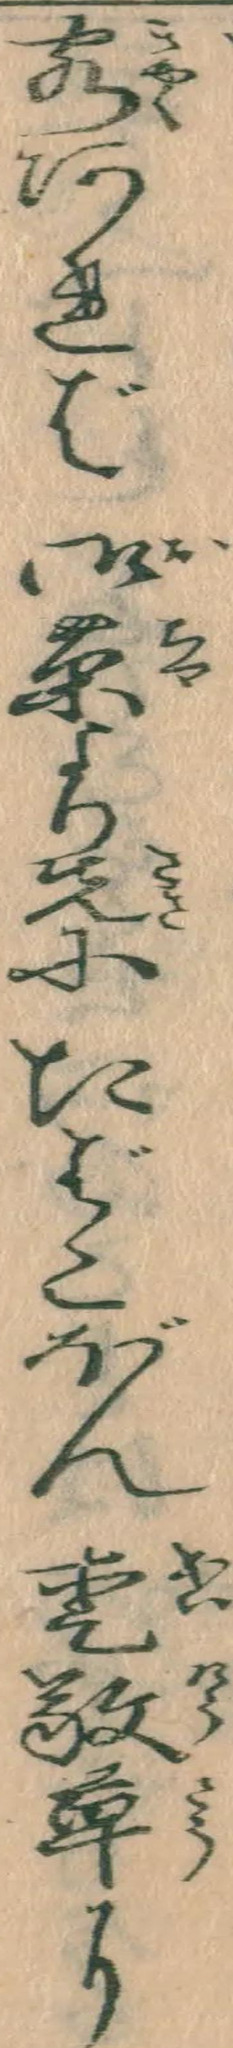客あれば御茶より先にたばこぼん愛敬草に
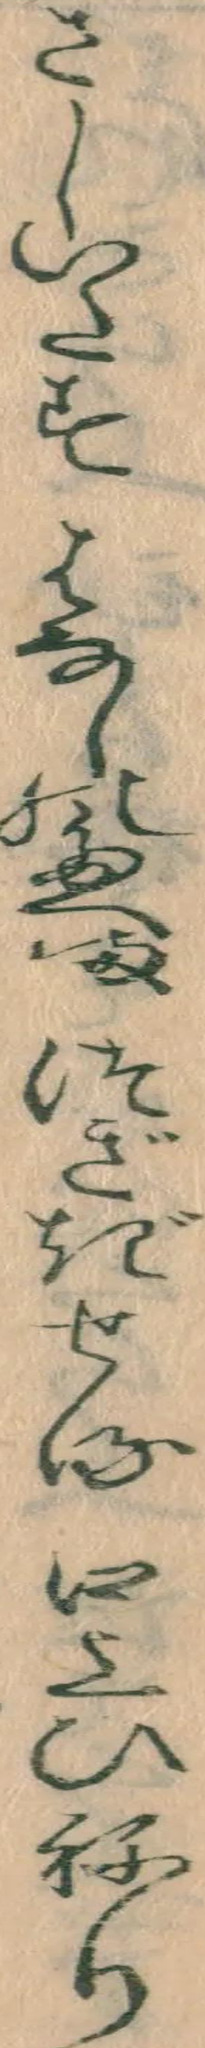さしいたすはなしのたへまつぎぎせる口上ひねり
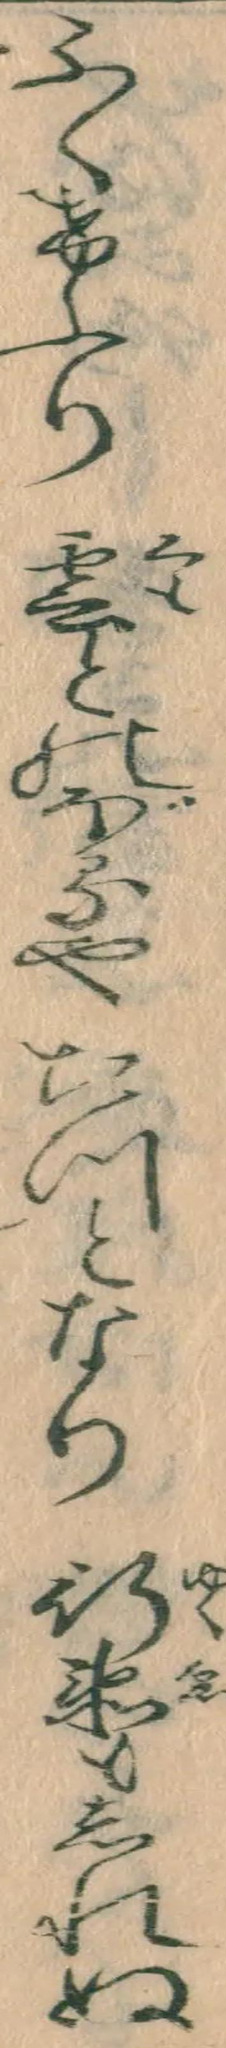ふくけふり雲とのぼるやたつとなり行衛もしれぬ
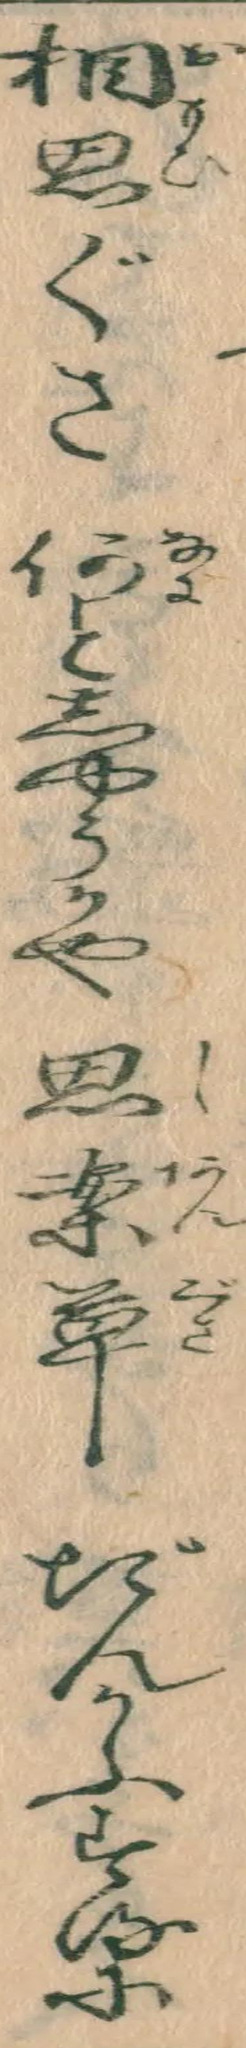相思ぐさ何としやうかや思案草だんかふするに
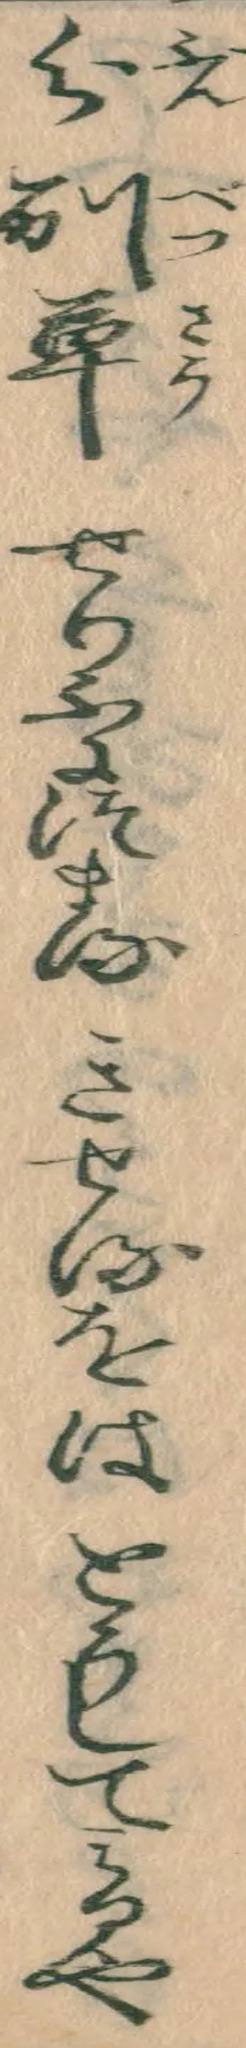分別草せりふにつまるきせるをはとうしてみるや
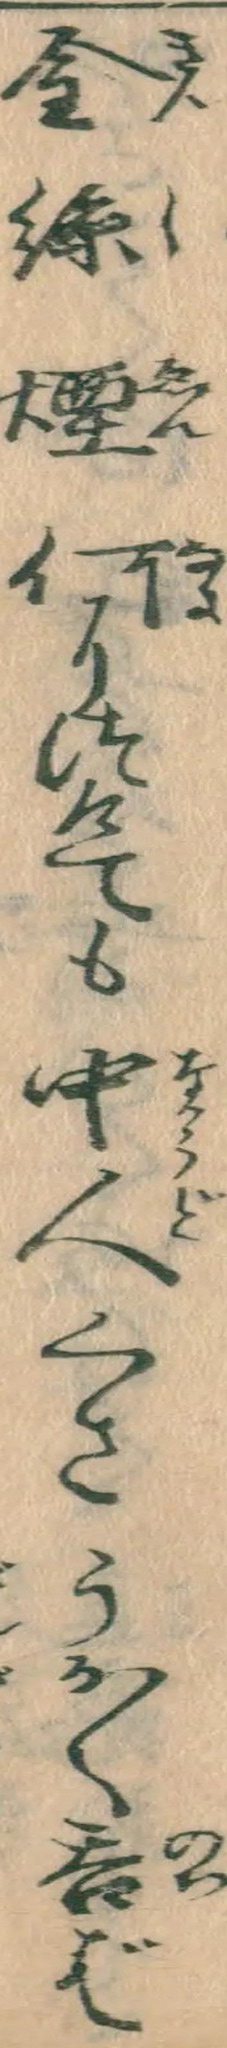金糸煙何につけても中人くさうか〳〵呑ば
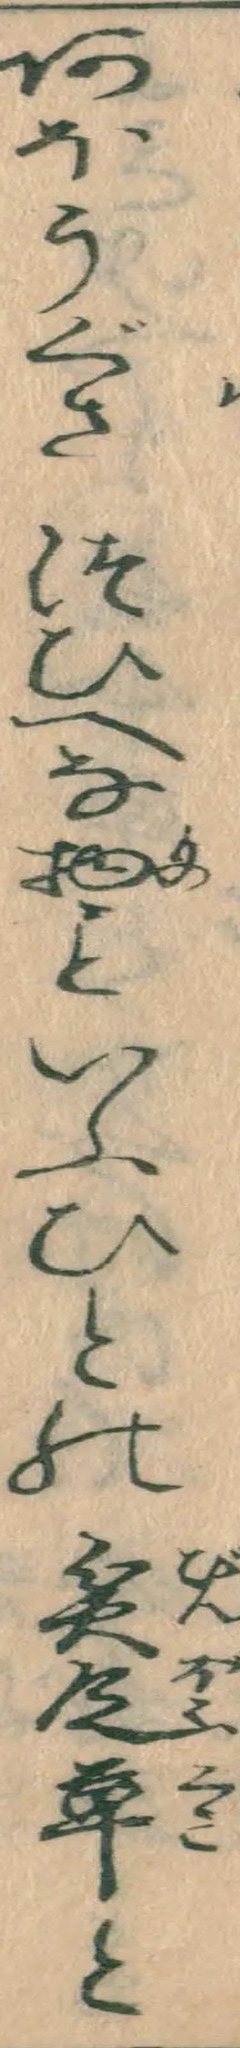あほうぐさつひへな物といふひとの貧乏草と
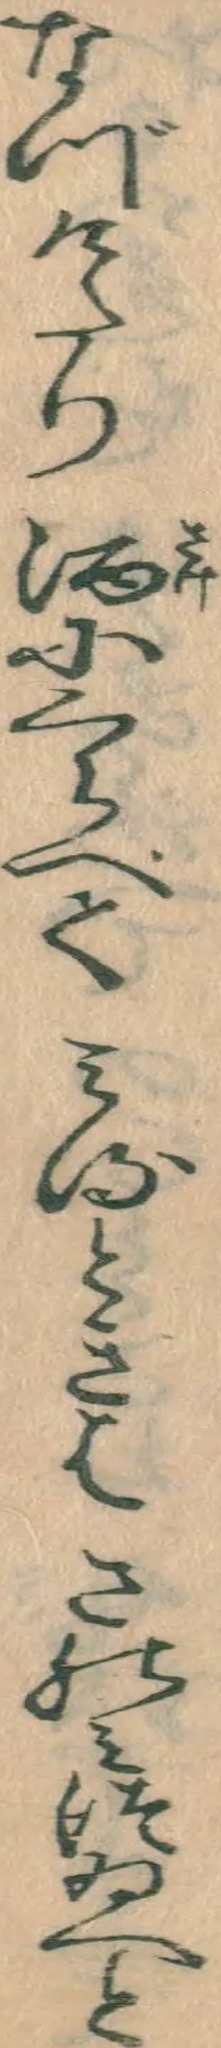なづけたり酒にくらべてみるときはさのみつゐへと

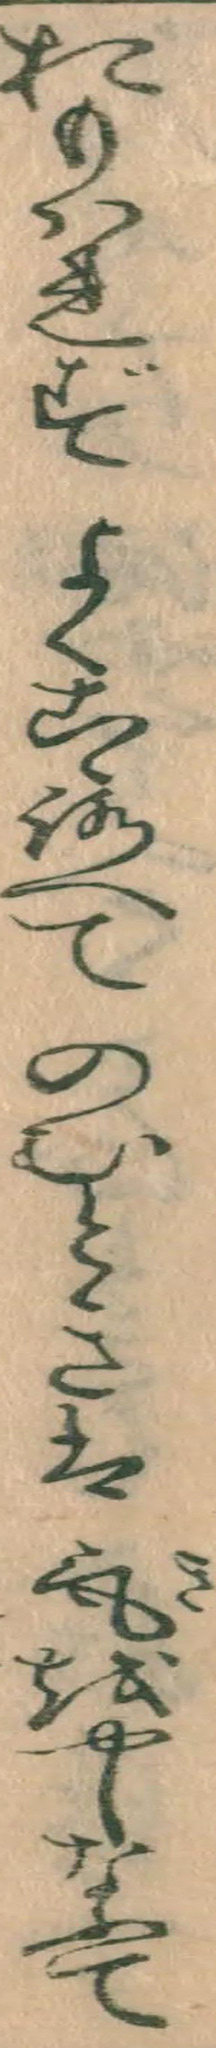おもはれずよくこゝろへてのむときは気をやしなふて
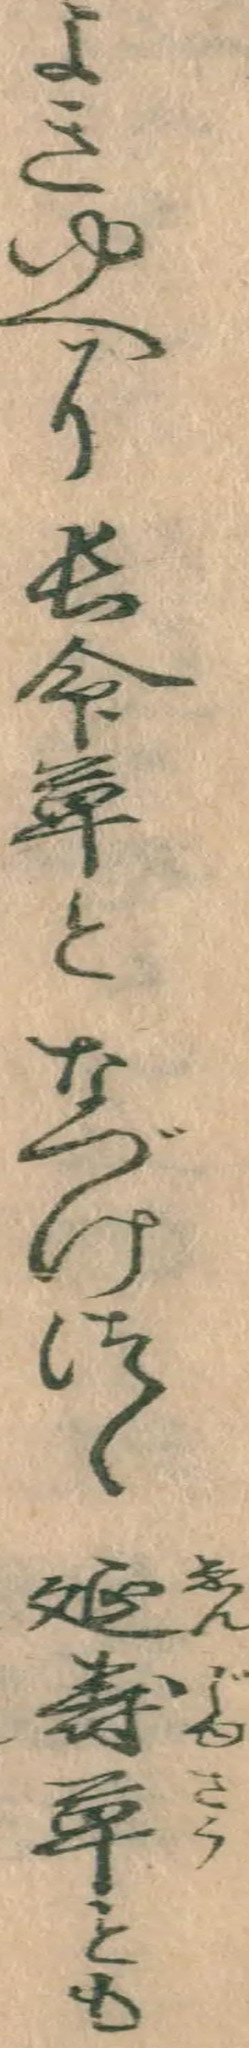よきゆへに長命草となづけつゝ延寿草とも
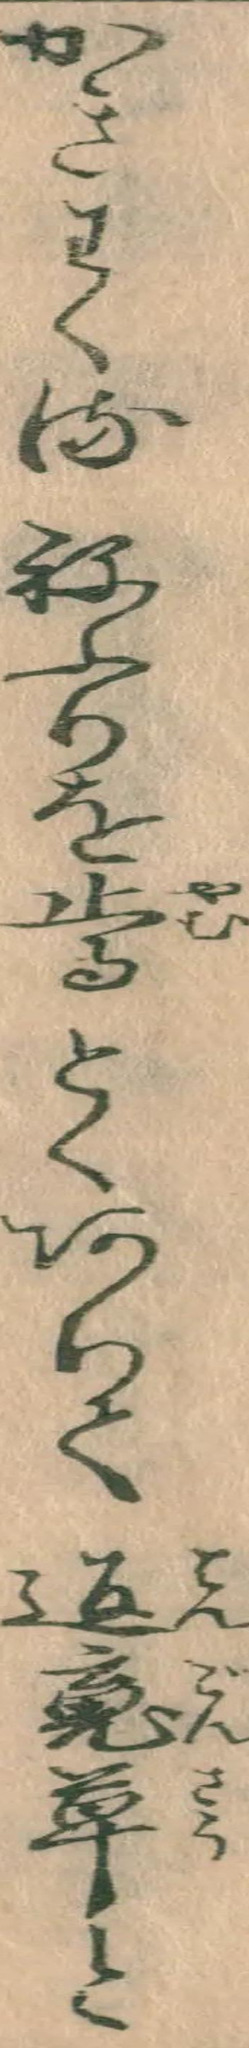かきわくるねふりを止るとくありて返䰟草と
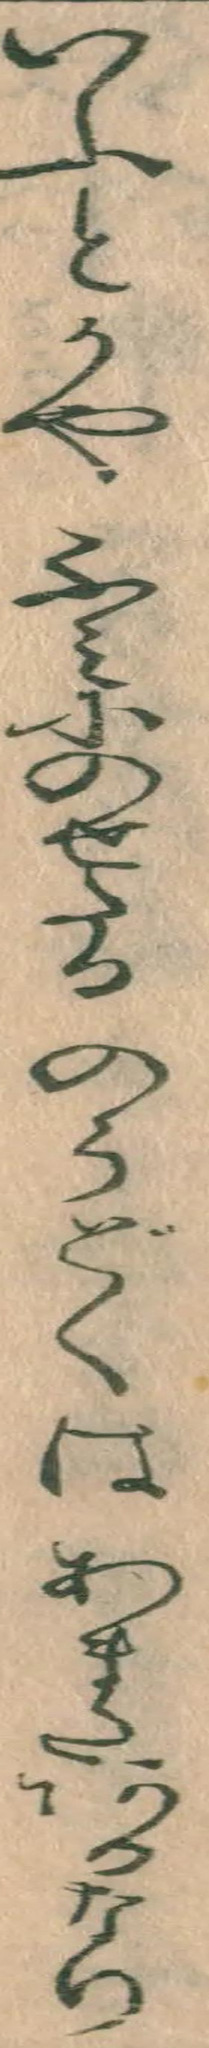いふとかやふみにのせたるのうどくはあまたあるなり
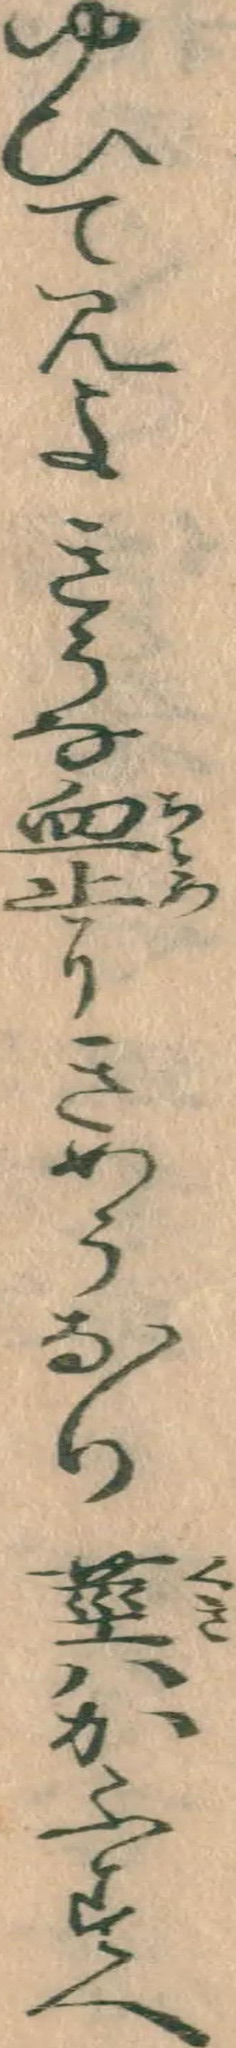ゆひて見よきうな血止にきめうなり茎はかふすへ
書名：煙草記
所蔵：国立国会図書館 National Diet Library, JAPAN
